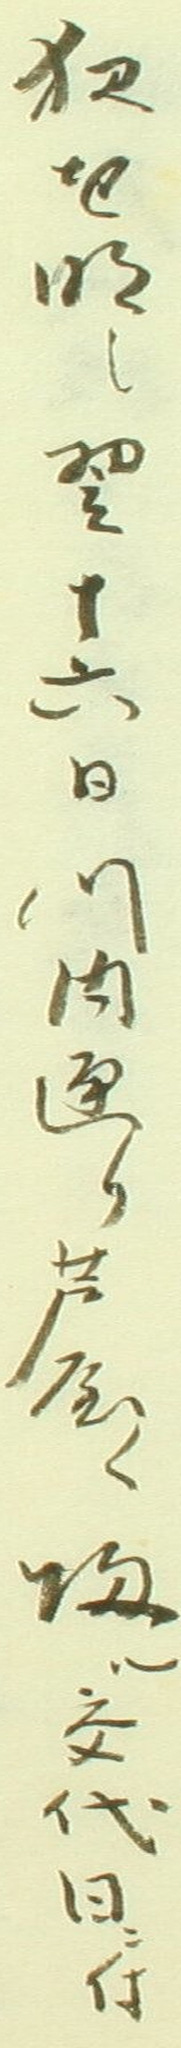夜を明し翌十六日川内通り芦屋へ帰る交代日に付
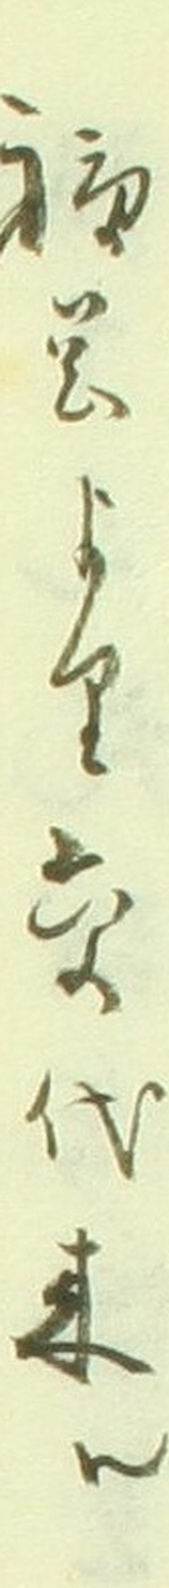福岡より交代来る
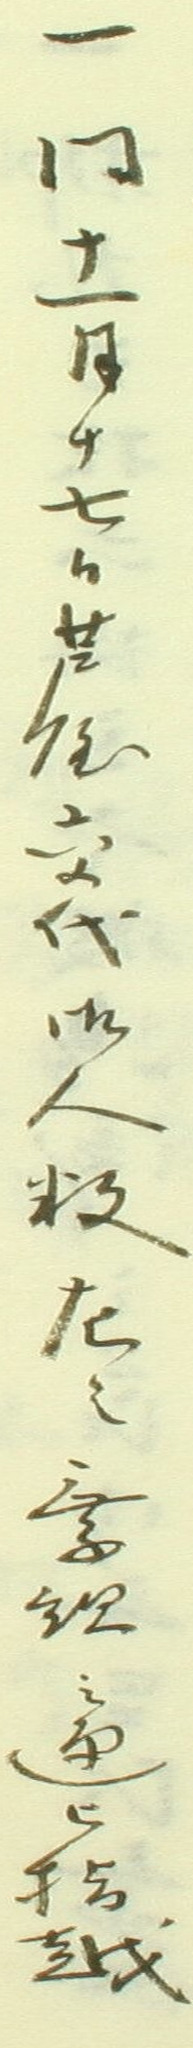一同十一月十七日芦屋交代御人数左之乗組之通被指越
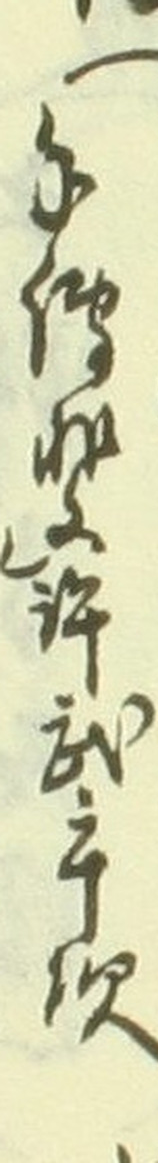手伝斐許武平次
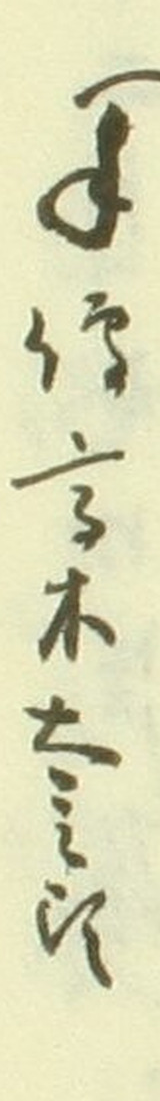手伝高木太三郎
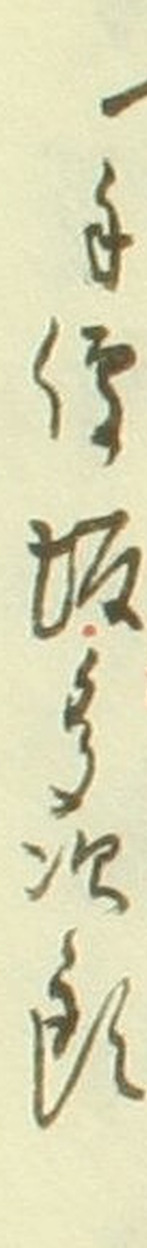手伝坂多次郎
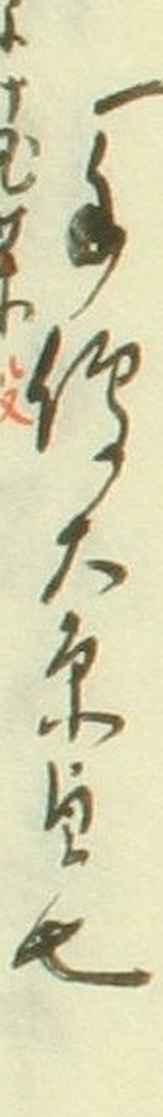手伝大原貞七
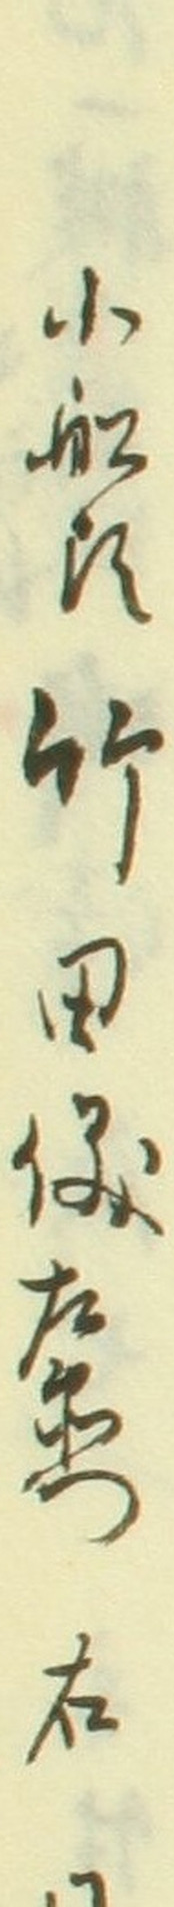一同小船頭竹田儀左衛門

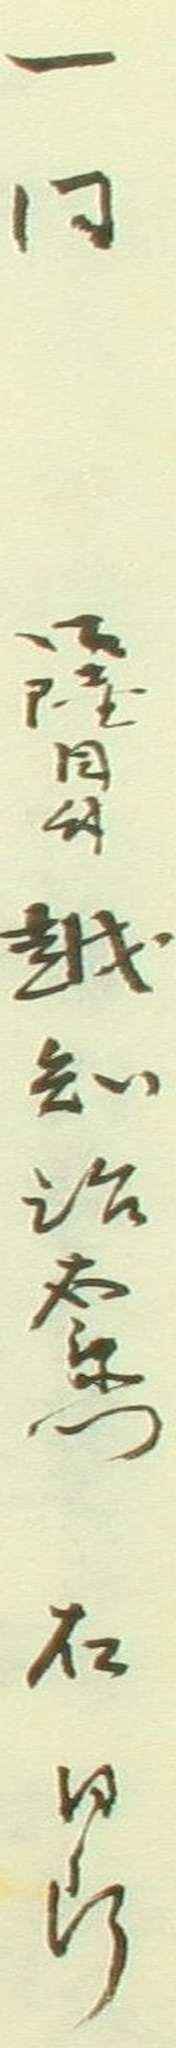一同御陸目付越知治右衛門右同断
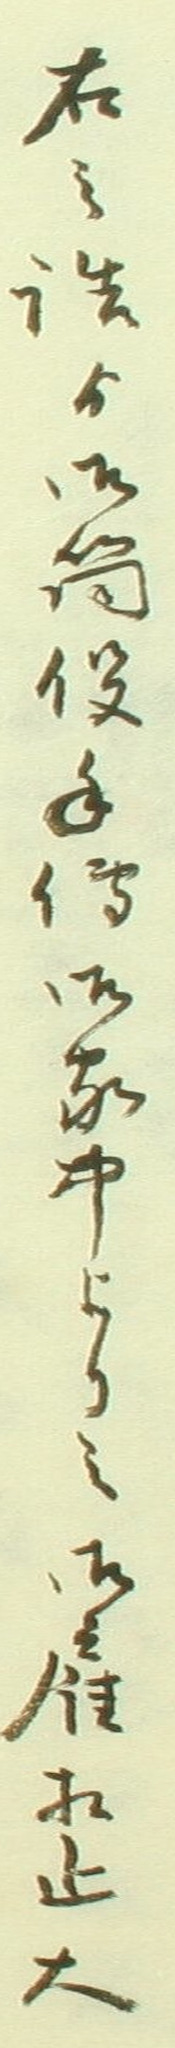右之諸ゟ御筒役手伝御家中より之御雇相止大
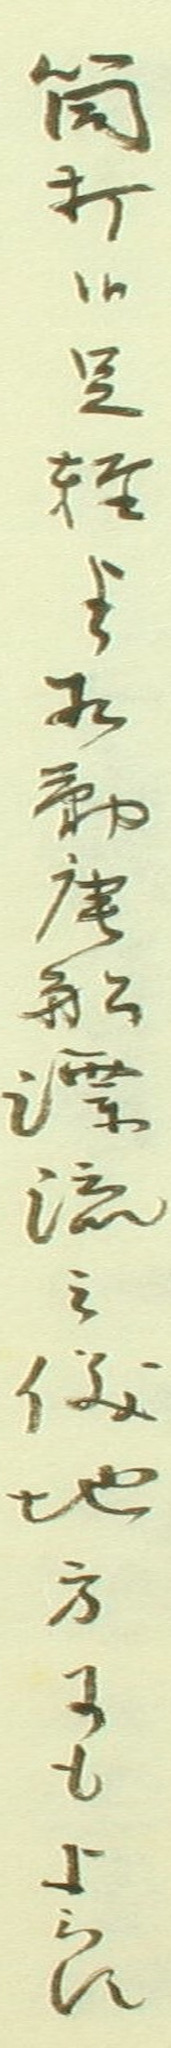筒打候足軽より相勤唐船漂流之儀地方にもよらす
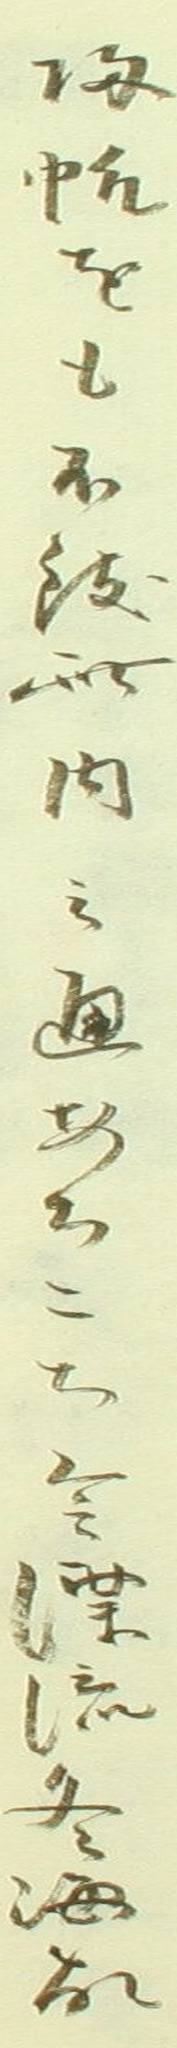満帆をも不致此内之通あちこち今漂流冬海故
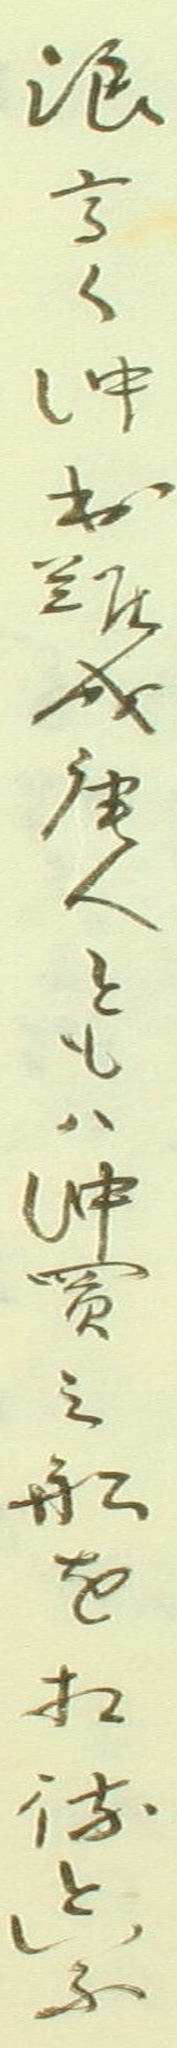浪高く沖出難成唐人ともは沖買之船を相備といふ
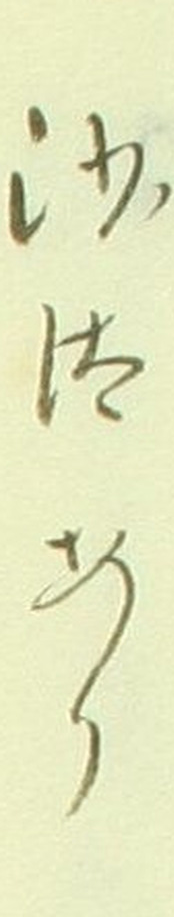沙汰あり
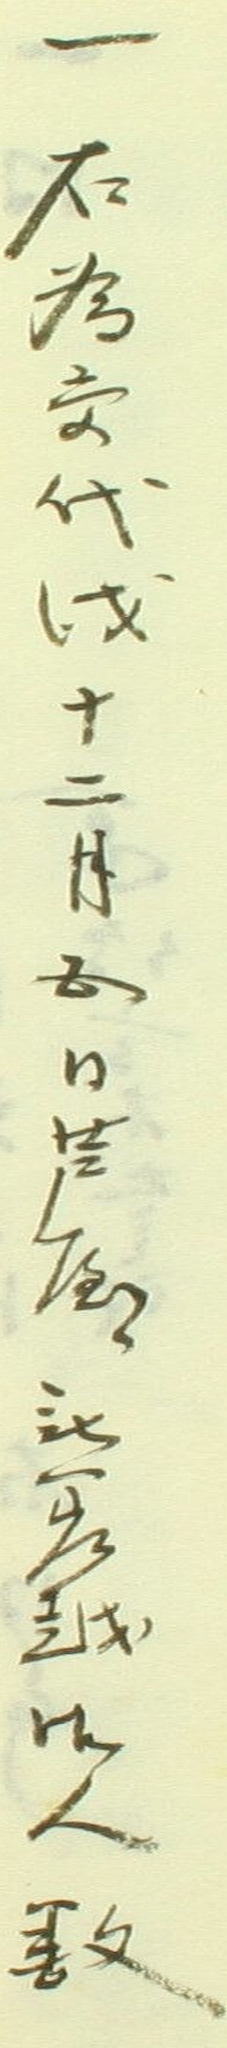一右為交代戌十二月五日芦屋へ被差越御人数
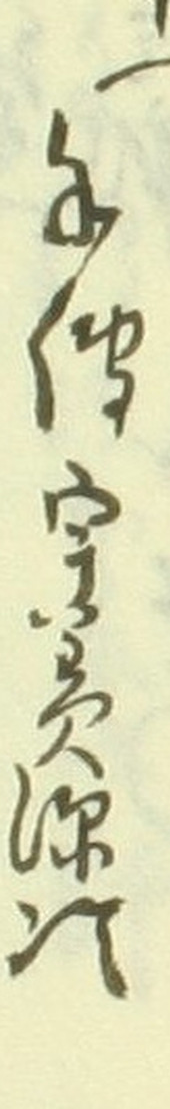手伝宇？源次
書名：唐船漂流記 三
